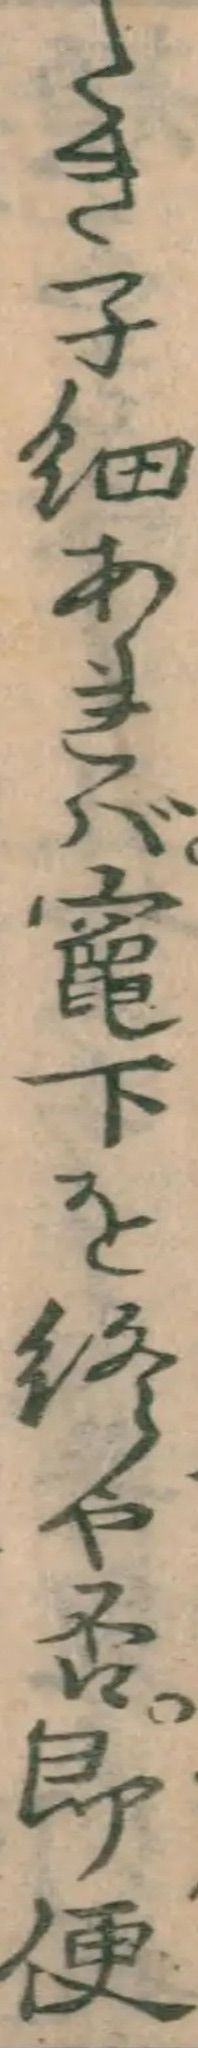たき子細あれば。竈下を終や否。即便
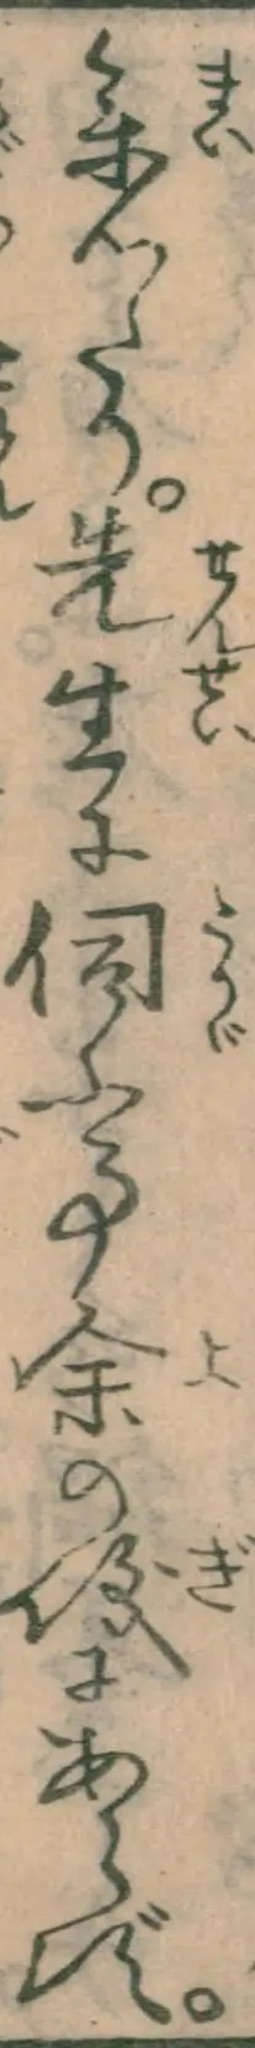参つたり。先生に伺ふ事余の儀にあらず。
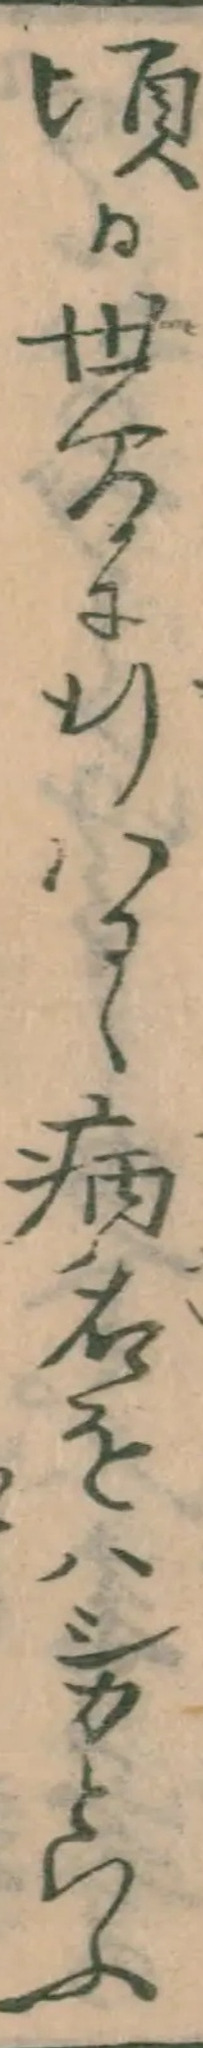頃日世間に行はるゝ病名をハシカといふ
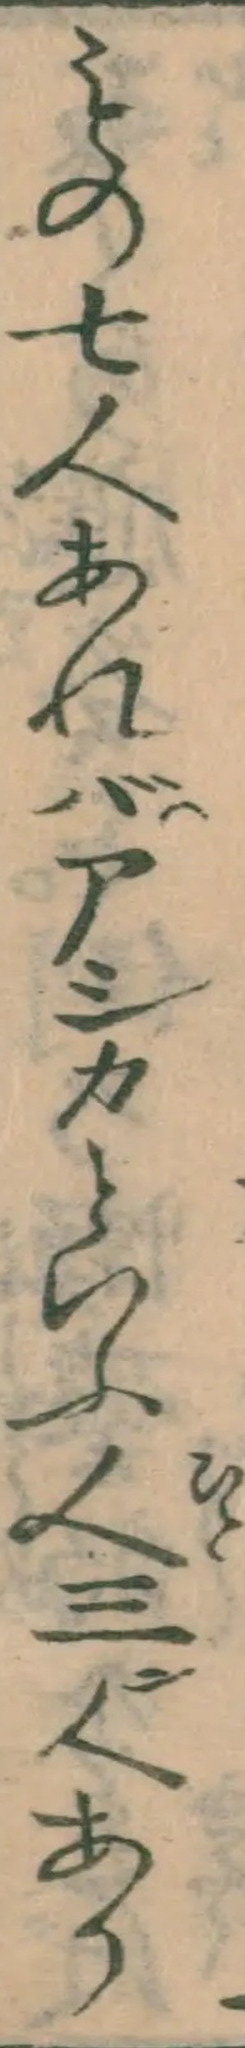もの七人あれば。アシカといふ人三ン人あり
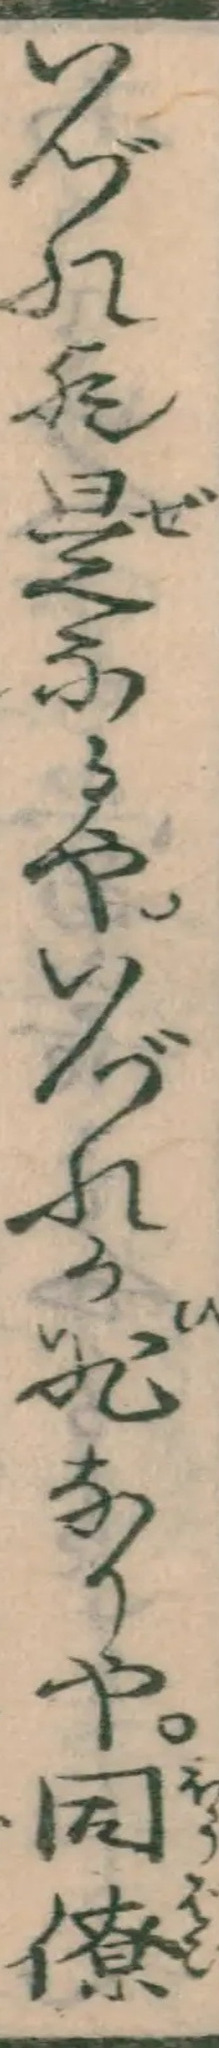いづれ歟是なるや。いづれか非なりや。同僚
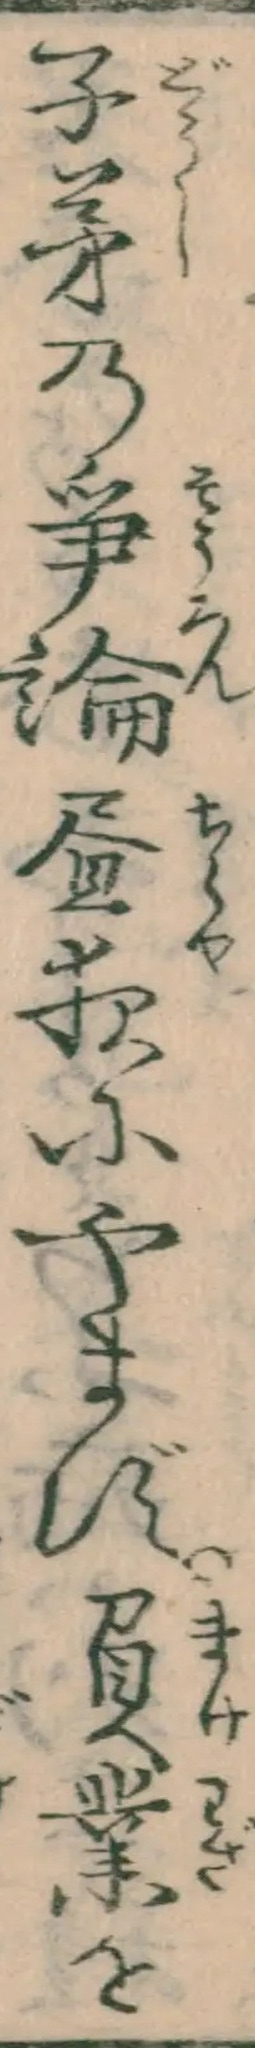子弟の争論昼夜にやまず。負業を
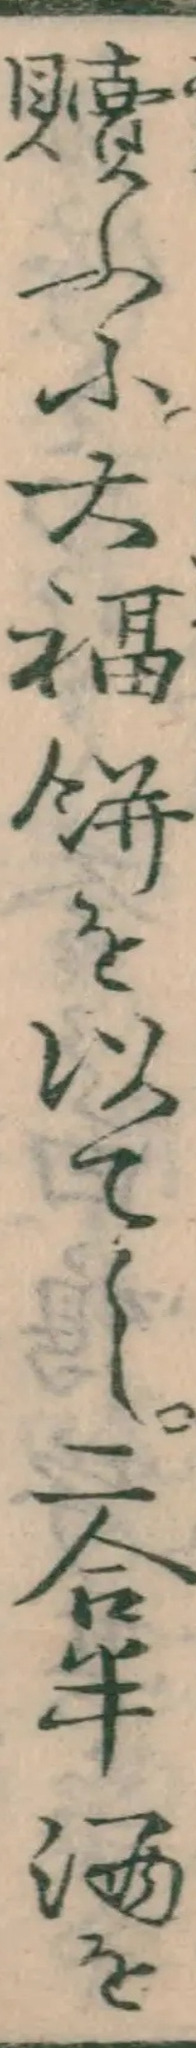贖ふに。大福餅を以てし。二合半酒を
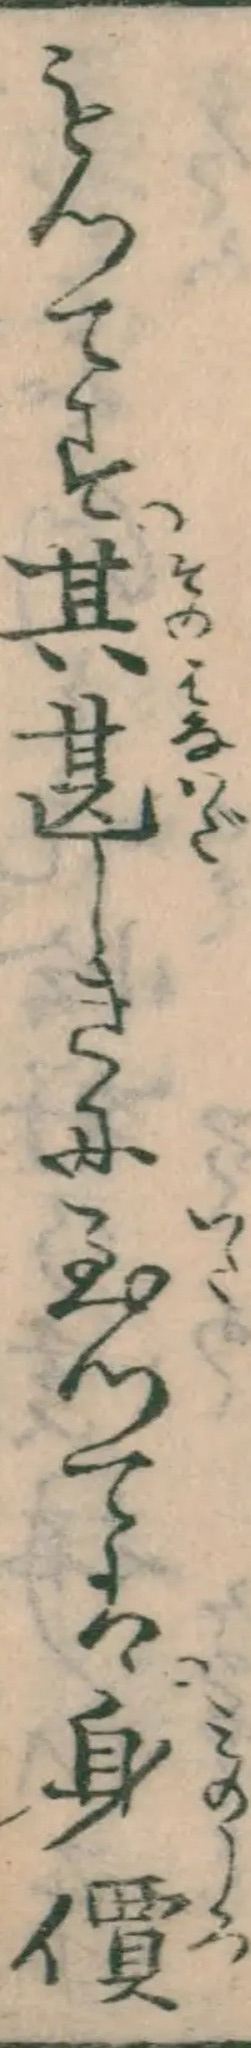もつてす。其甚しきに至つては。身價
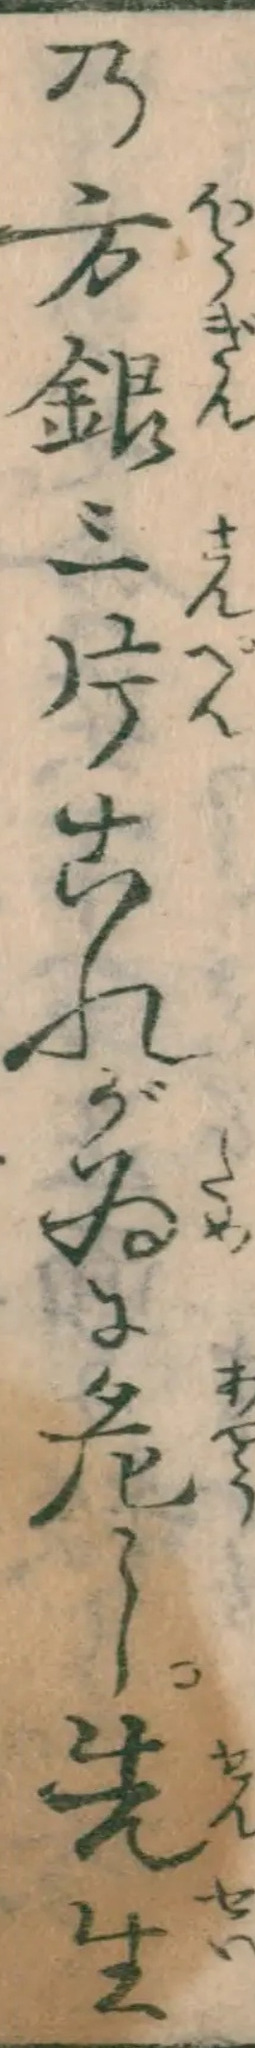の方銀三片これが為に危し。先生
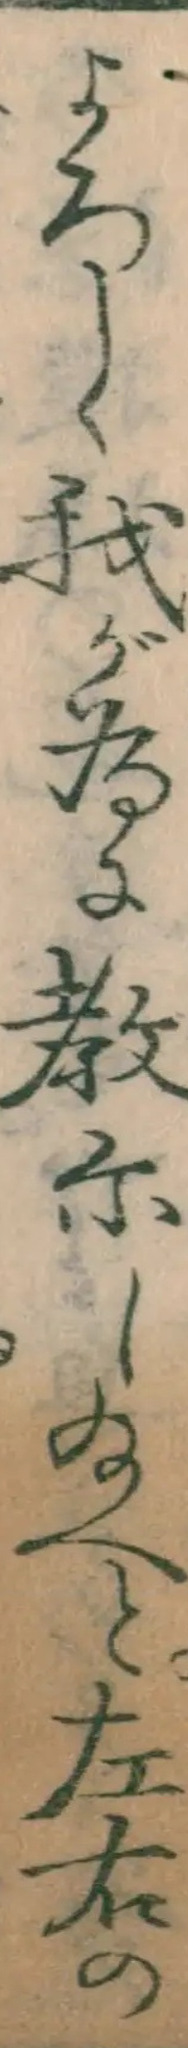よろしく我が為に教示し給へと。左右の
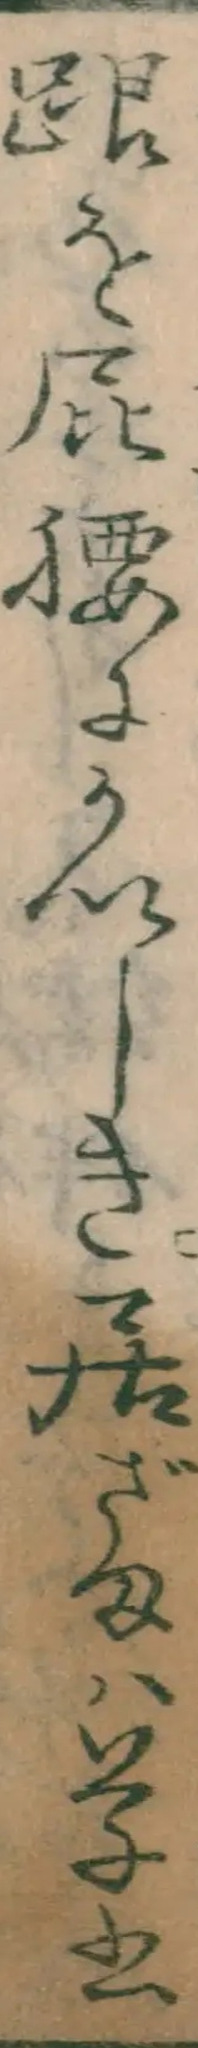跟を屁腰にかいしき。居ざまは草書

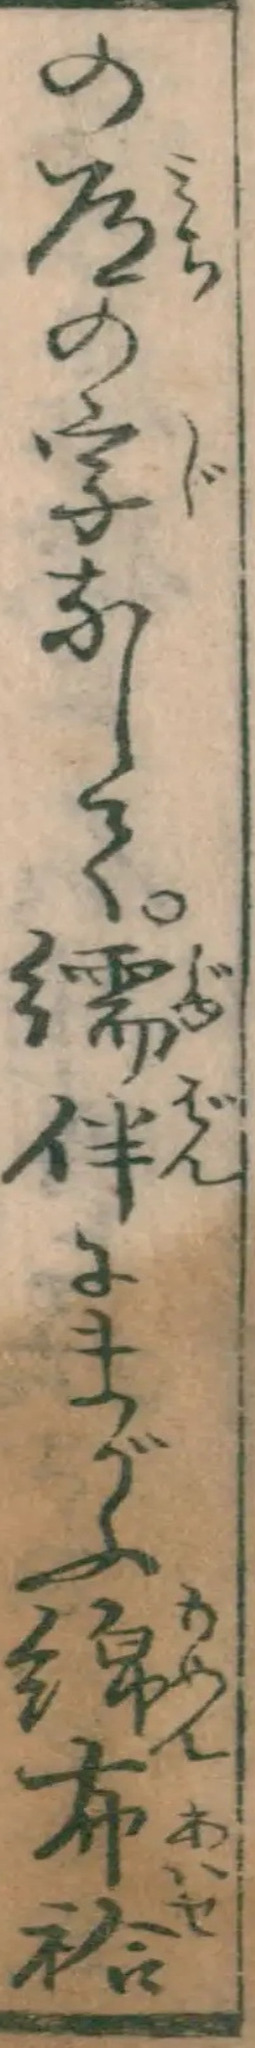の道の字なして。襦袢にまがふ綿布袷
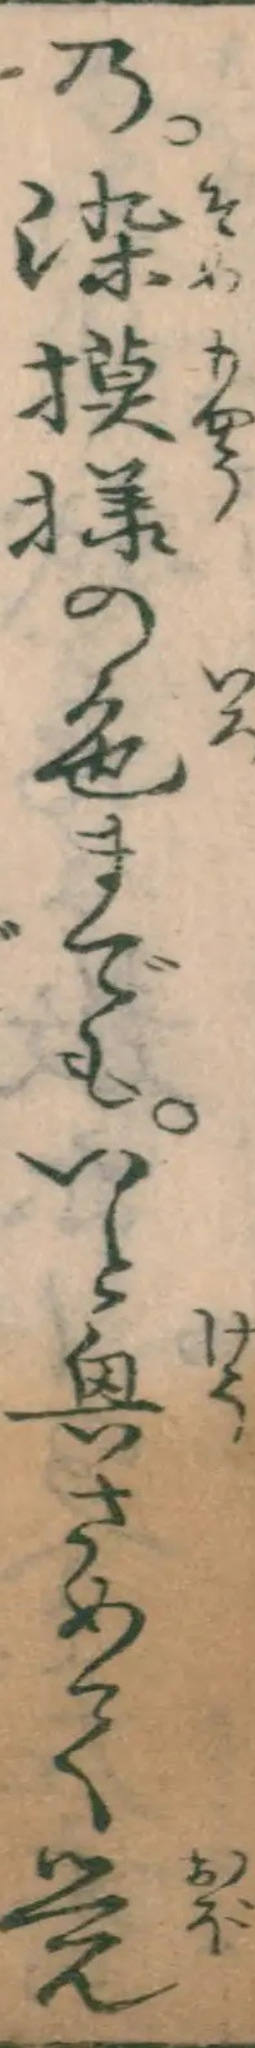の。染模様の色までも。いと興さめて覚
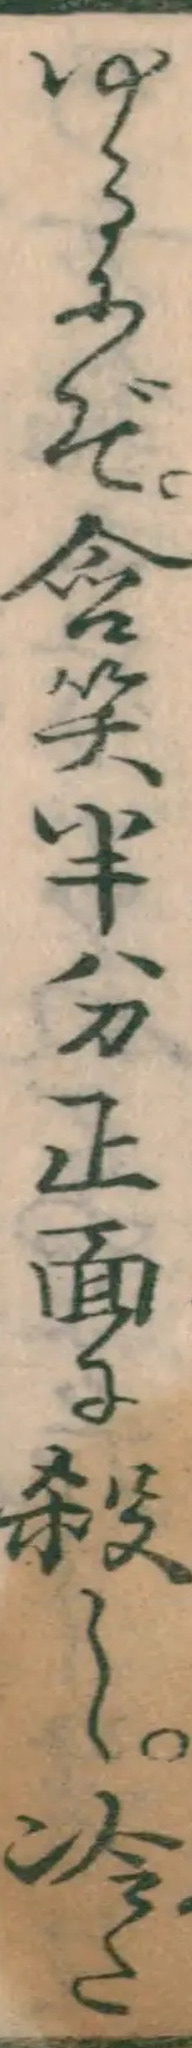ゆるにぞ。含笑半分正面に殺し。冷た
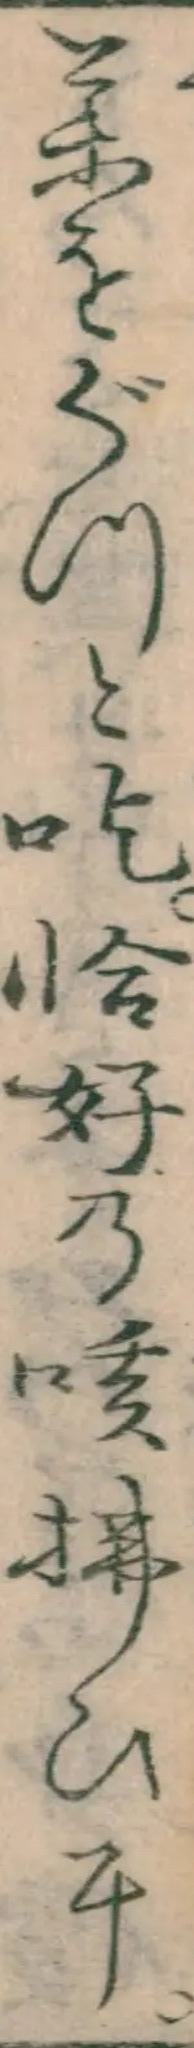薬をぐつと吃。恰好の咳払ひに。
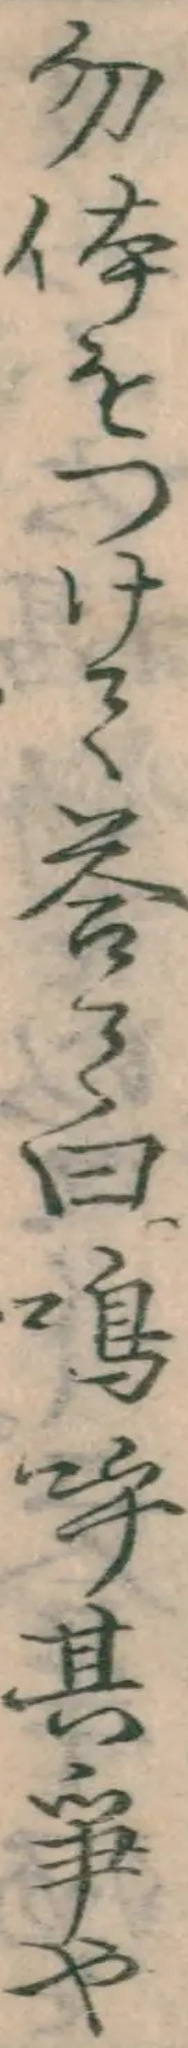勿体をつけて答て曰。嗚呼其争や
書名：麻疹戯言
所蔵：国立国会図書館 National Diet Library, JAPAN
